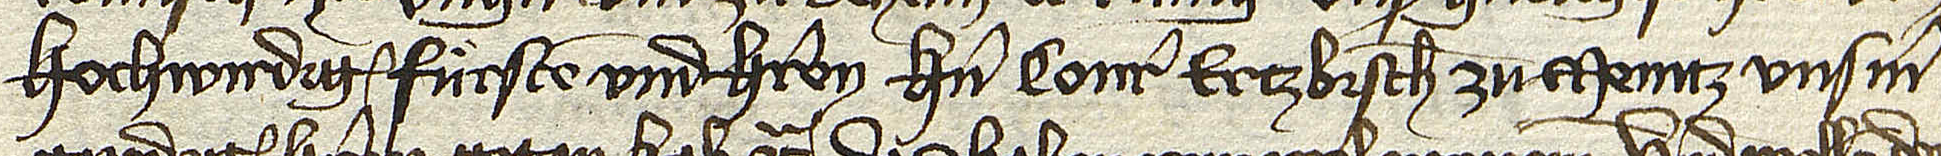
hochwirdig* fürſte* vnd hren* hn* Conr* Ercʒbiſch* ʒu Meincʒ vnſm*
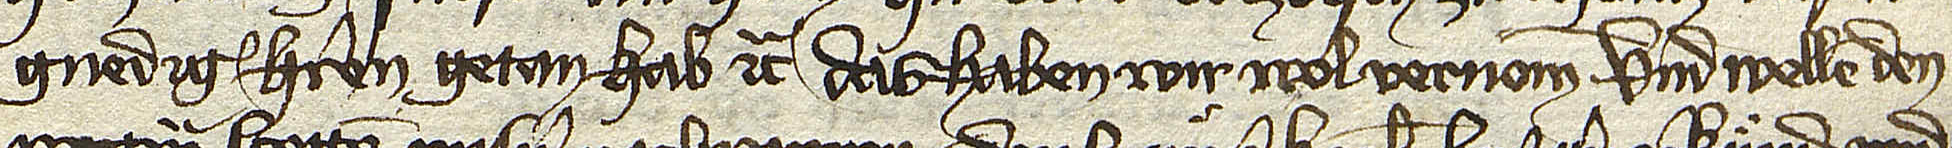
gnedig* hren* getan hab ec* das haben wir wol vernom* Vnd welle* den
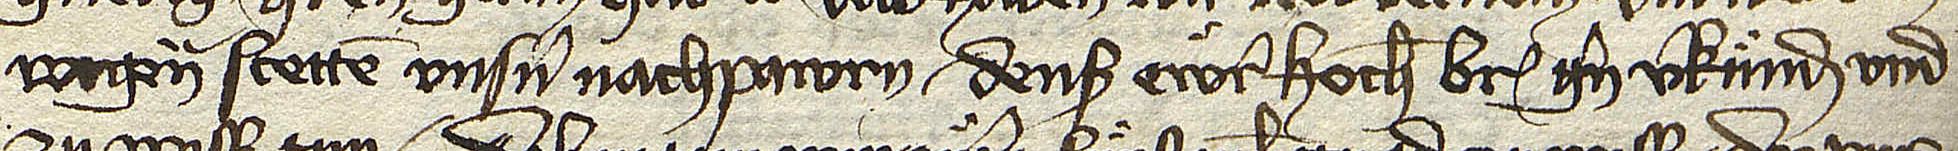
vorgen* ſtette* vnſn* nachpawrn / denſ* ewr hoch* br* gn* v*künd* vnd
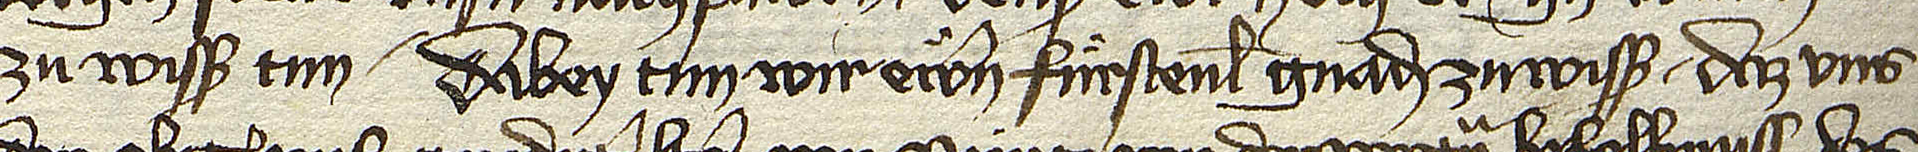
ʒu wiſſ* tun / Dabey tun wir ewn* fürſtenl* gnad* ʒu wiſſ* / daʒ vns
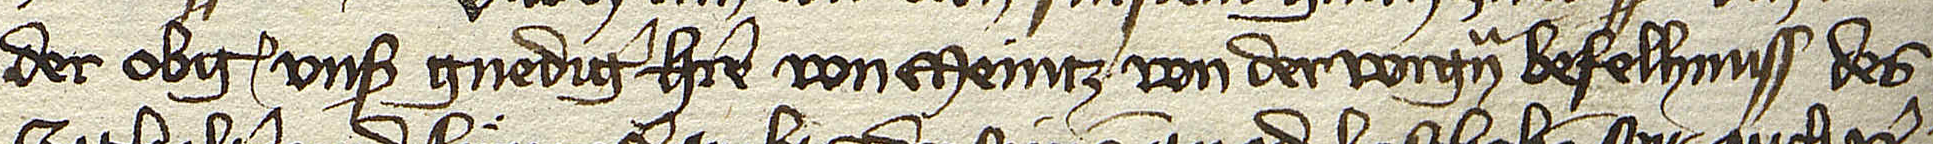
der obg* vnſ* gnedig* hre* von Meincʒ . von der vorgn* befelhnuſſ des
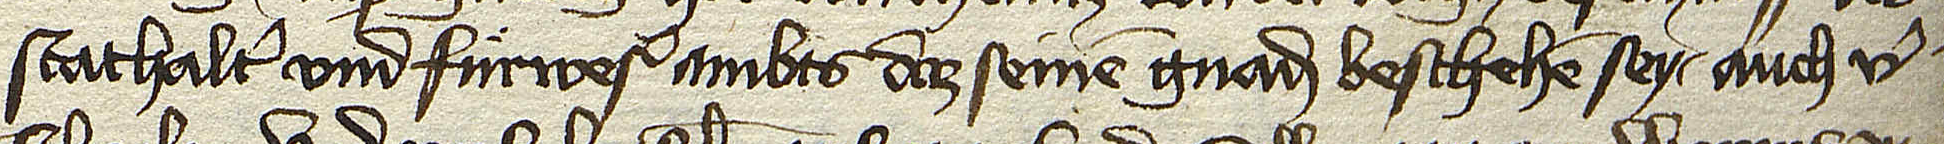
ſtathalt* vnd fürweſ* ambts daʒ ſeine* gnad* beſchehe* ſey / auch v* -
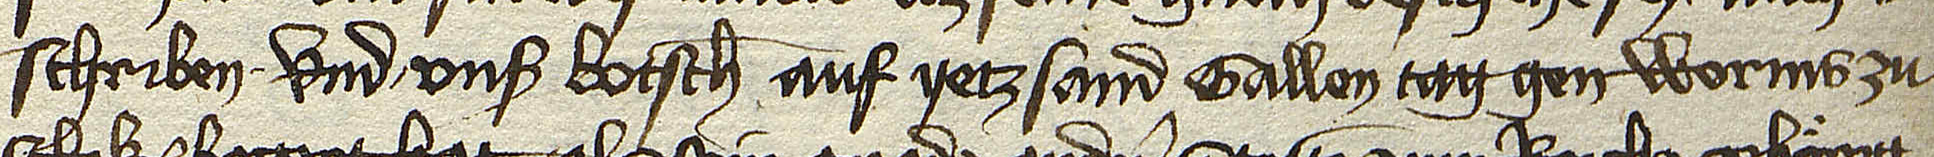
ſchriben . Vnd / vnſ* botſch* auf yecʒ ſand Gallen tag gen Worms ʒu
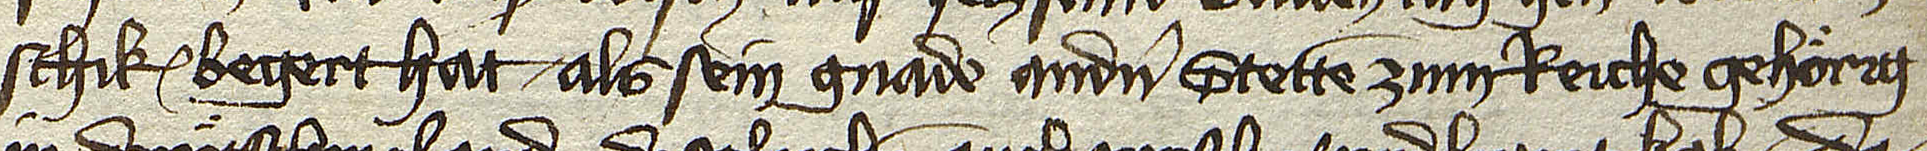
ſchik* begert hat / als ſein gnade andn* Stette* ʒvm Reiche gehörig
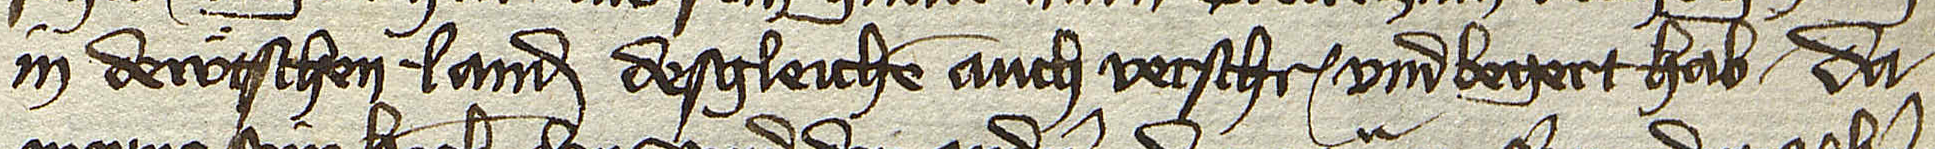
in dewtſchen land* deſgleiche* auch verſchr* vnd begert hab / Da
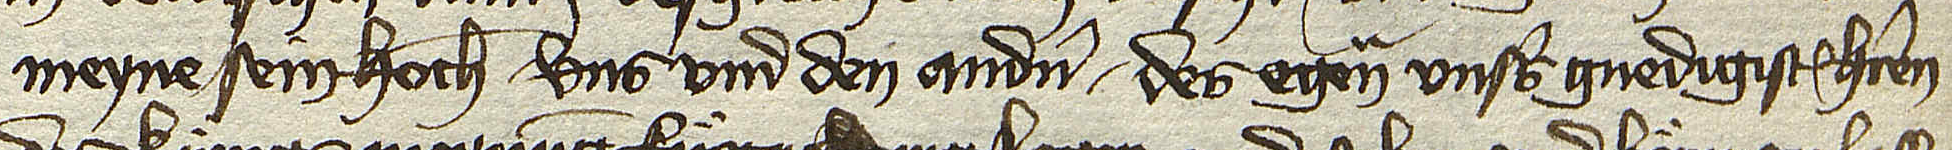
meyne ſein hoch* / Vns vnd den andn* / des egen* vnſ*s gnedigiſt* hren*
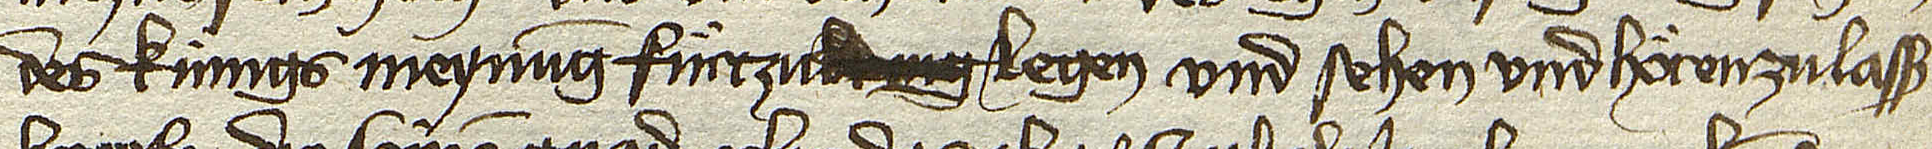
des künigs meynug* fürcʒubringlegen vnd ſehen vnd hören ʒu laſſ*
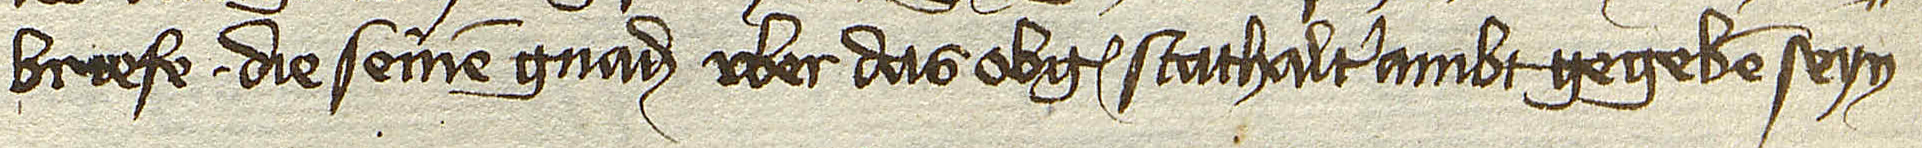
briefe . die ſeine* gnad* vber das obg* ſtathalt* ambt gegebe* ſeyn
